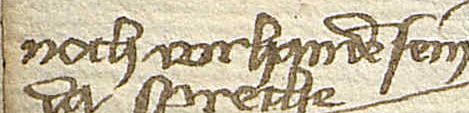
noch vorhande* ſein
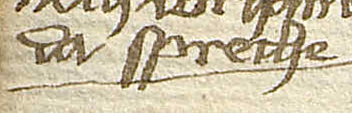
da ſpreche
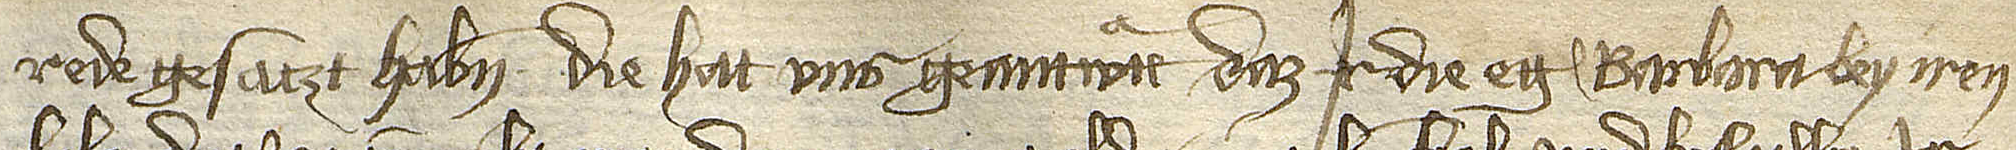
rede geſacʒt habn* die hat vns geantw*t / Daʒ Ir die eg* Barbara bey iren
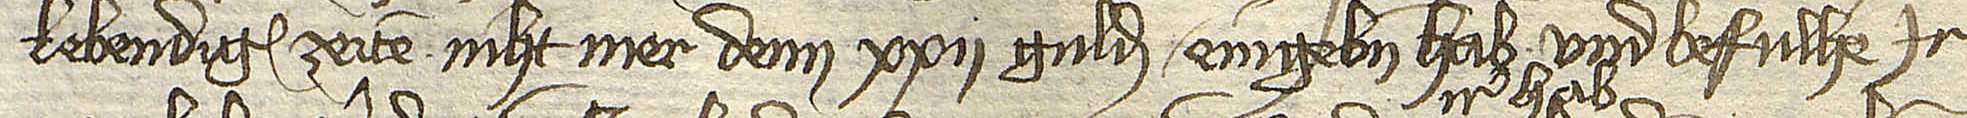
lebendig* ʒeite* niht mer denn xxii guld* / eingebn* hab vnd befulhe Ir
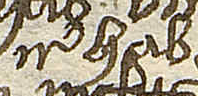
ir* hab
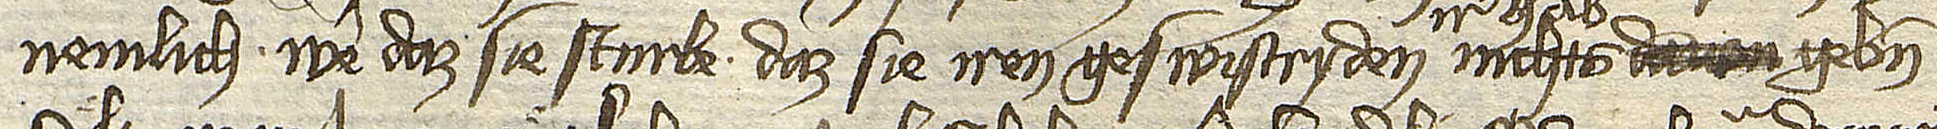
nemlich . w*e daʒ ſie ſturbe . daʒ ſie iren geſwiſtryden nichts dauon gebn*
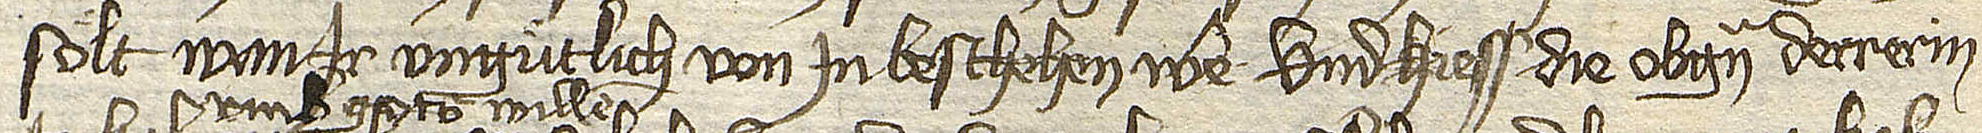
ſölt wan Ir vngütlich von In beſchehen w*e Vnd hieſſ die obgn* derrerin
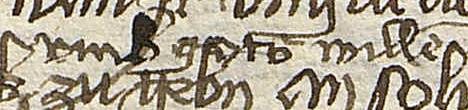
vmb gots wille*
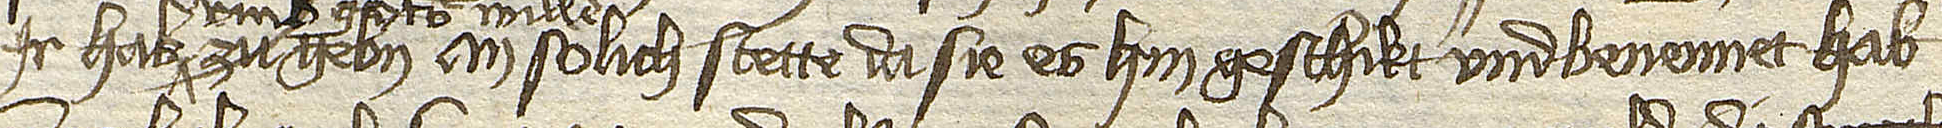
Ir hab ʒu gebn* an ſölich ſtette da ſie es hin geſchikt vnd benennet hab
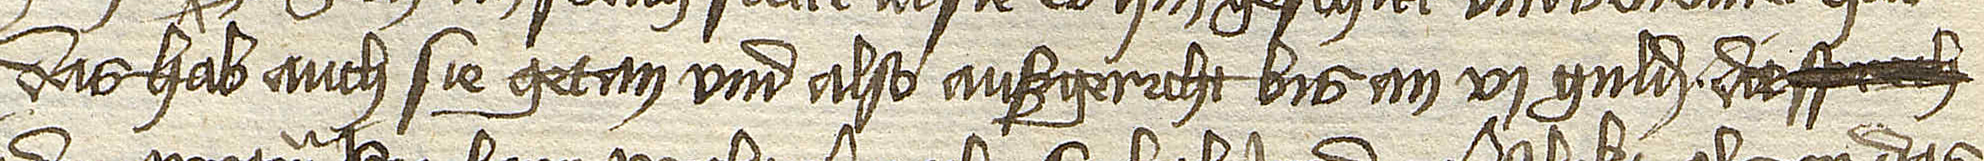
Das hab auch ſie getan vnd alſo auſʒgericht bis an vi guld* . Da ſprech
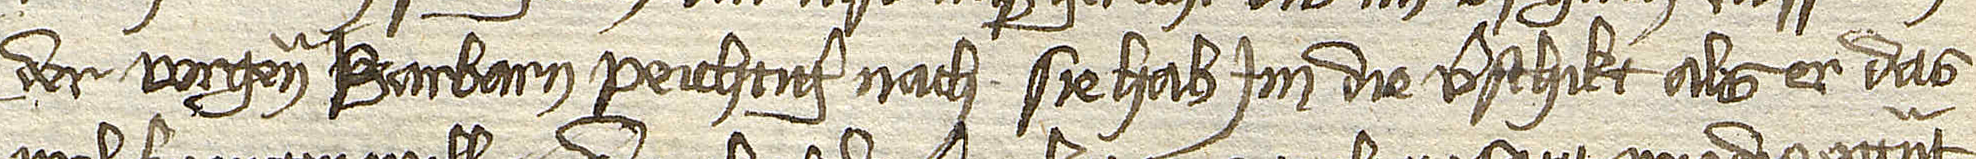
der vorgen* Barbarn Peichtig* nach . ſie hab Im die v*ſchikt als er das
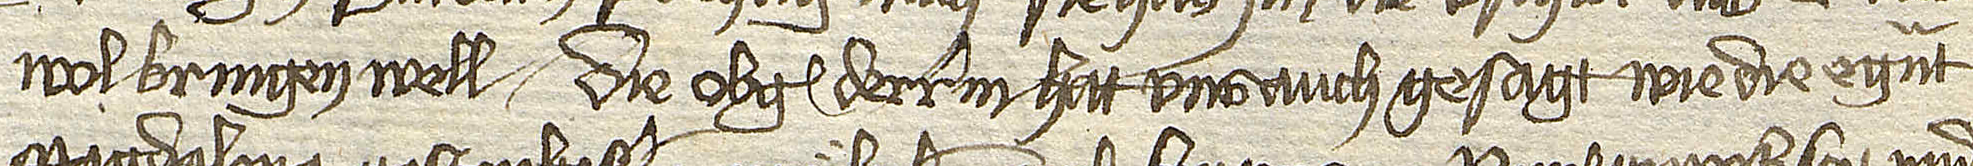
wol bringen well / Die obg* derr*in hat vns auch geſagt wie die egnt*
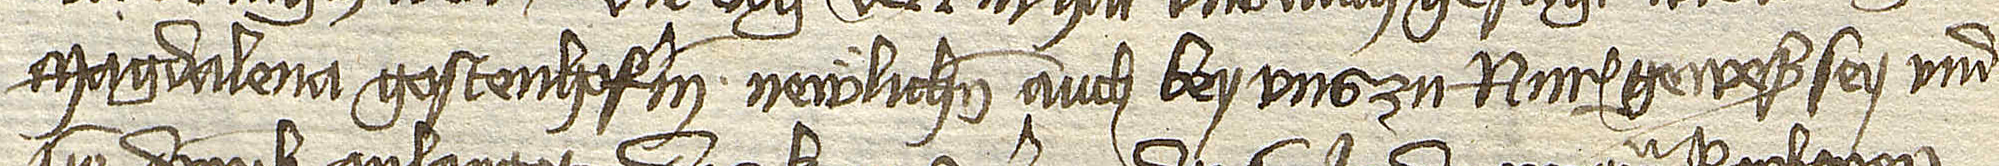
Magdalena goſtenhof*in . neẅlichn* auch bey vns ʒu Nur* geweſ* ſey vnd
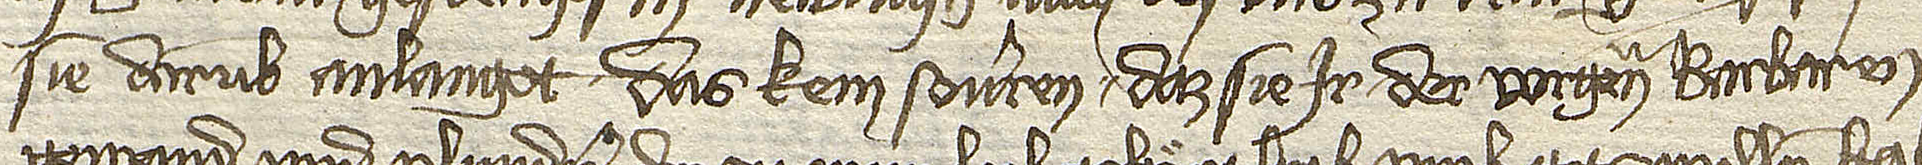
ſie darub* anlanget . Das kem ſou*ren / daʒ ſie Ir / der vorgen* Barbaren
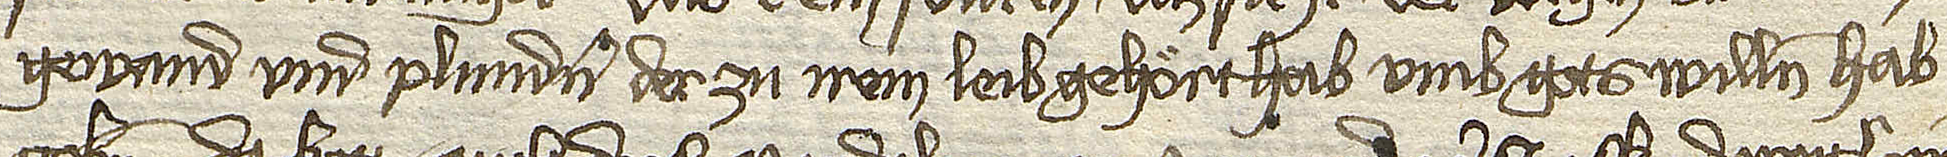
gewand vnd plund*n der ʒu iren leib gehört hab vmb gots willn* hab
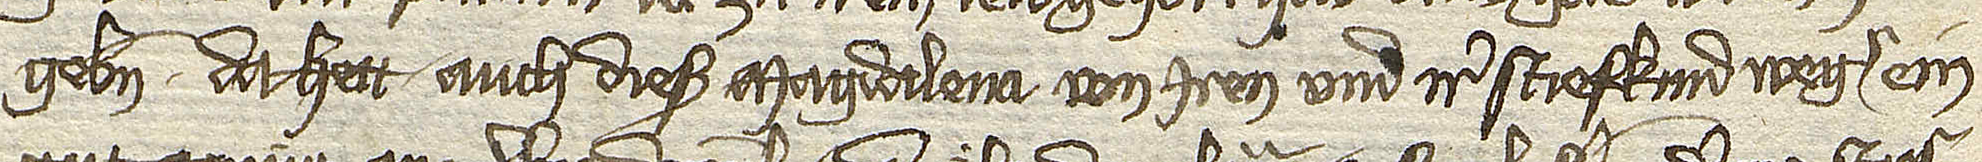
gebn* / da hett auch dieſ* Magdalena von Iren vnd ir* ſtiefkind weg* ein
